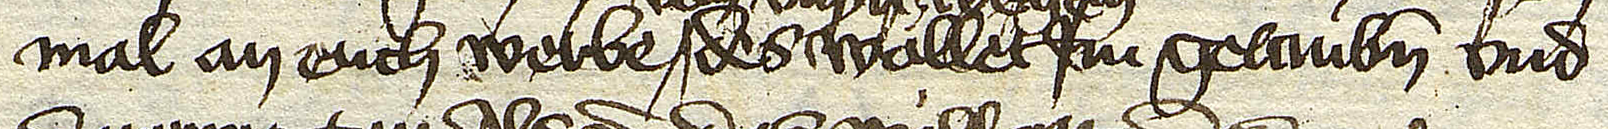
mal an ewch werbe des wöllet Im gelaub*n vnd
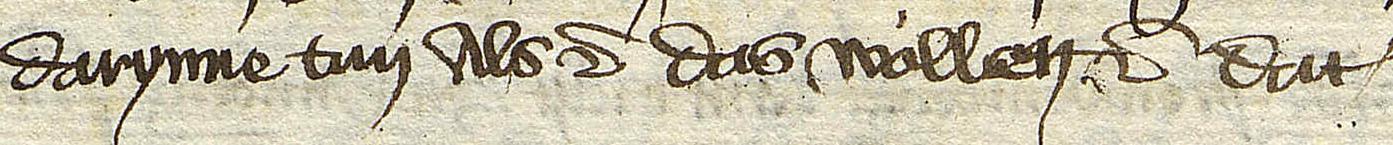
darynne tun Als ec* das wöllen ec* Dat*
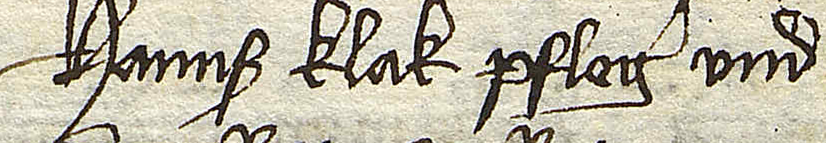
Hannſ* klak Pfleg* vnd
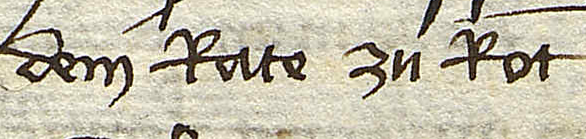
dem Rate ʒu Rot
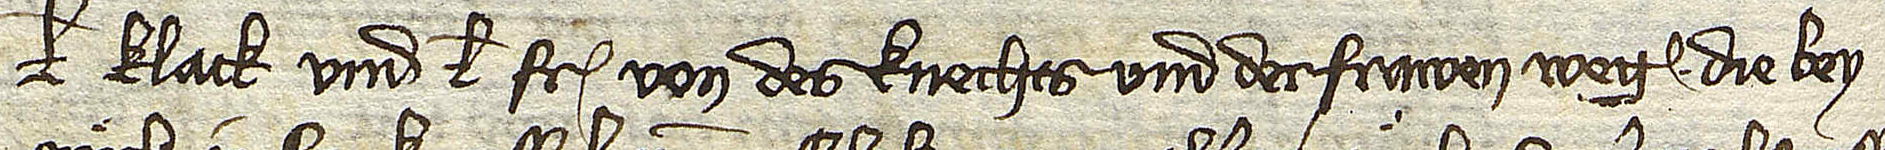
L* klack vnd l* fr* von des knechts vnd der frawen weg* . die bey
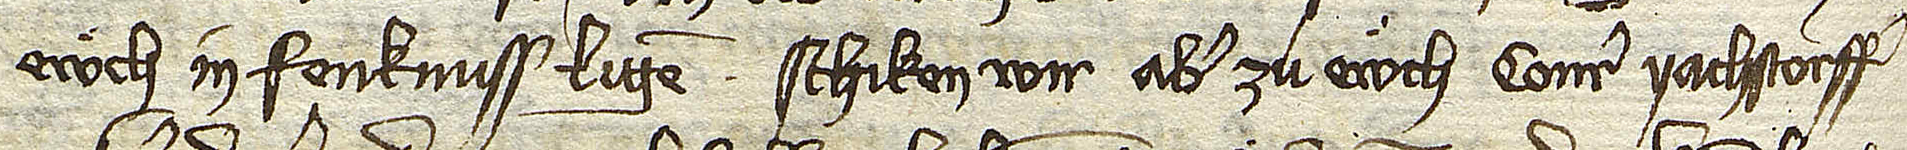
ewch in fenknuſſ lige* . ſchiken wir ab* ʒu ewch Conr* yachſtorff*
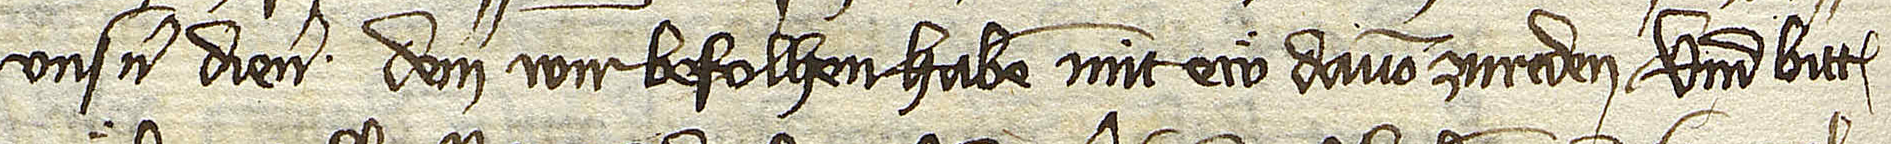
vnſ*n dien* . Dem wir befolhen habe* mit ew dauo* ʒureden / Vnd bitt*
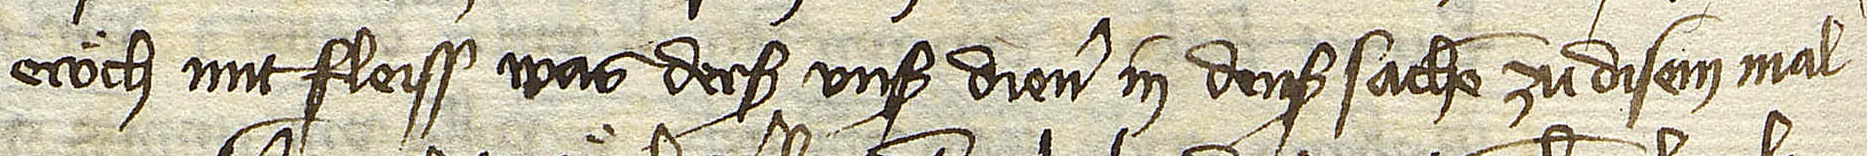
ewch mit fleiſſ was derſ* vnſ* dien* in denſ* ſache* ʒu diſem mal
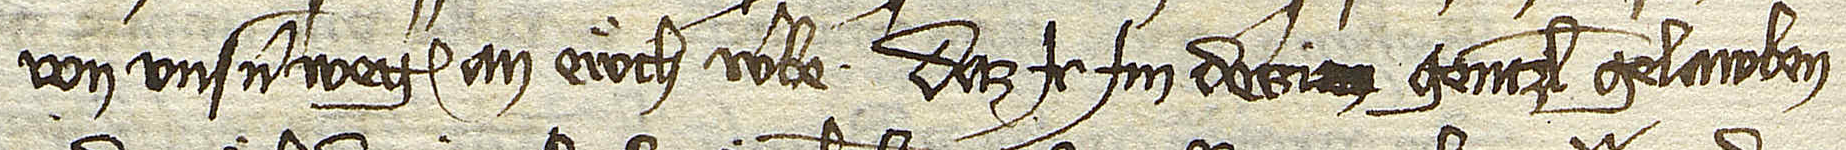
von vnſ*n weg* an ewch w*be . Daʒ Ir Im des im gencʒl* gelawben
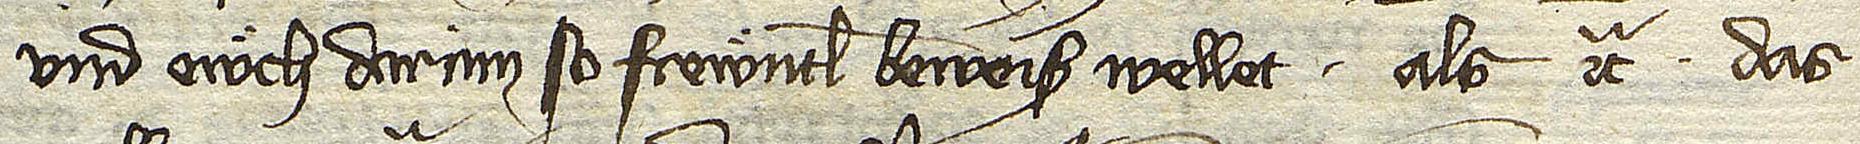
vnd ewch darinn ſo frewntl* beweiſ* wellet . als ec* . das
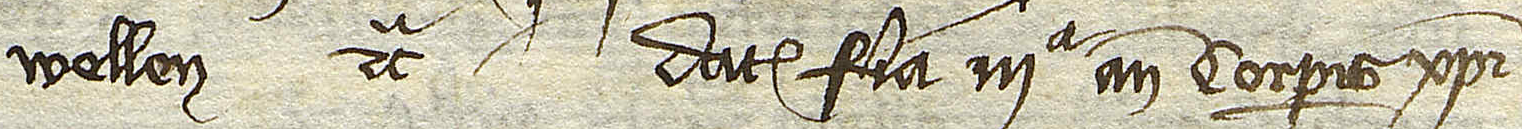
wellen ec* / Dat* fia* iii* an* Corp*is xpi*
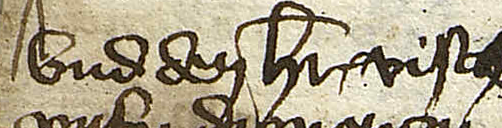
vnd den H*r viſch*
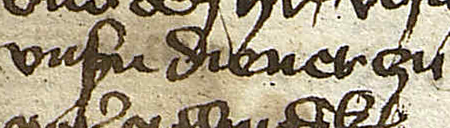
vnſ*n diener cʒu
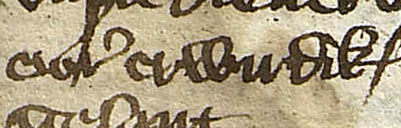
ewr* erwirdik*
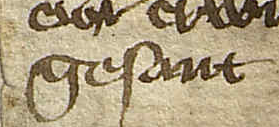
geſant
